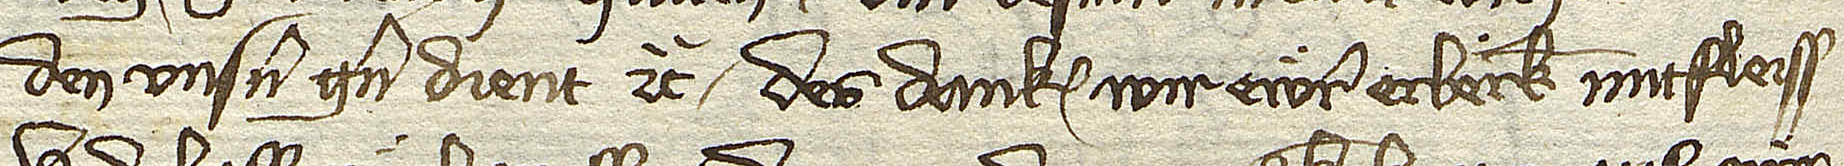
den vnſ*n g*n dient ec* / des dank* wir ew*r erberk* mit fleiſſ
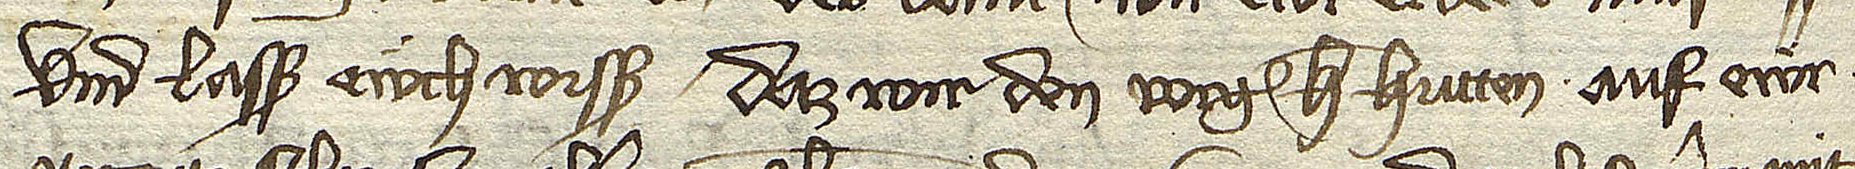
Vnd laſſ* ewch wiſſ* / daʒ wir den vorg* h* hutten . auf ewr
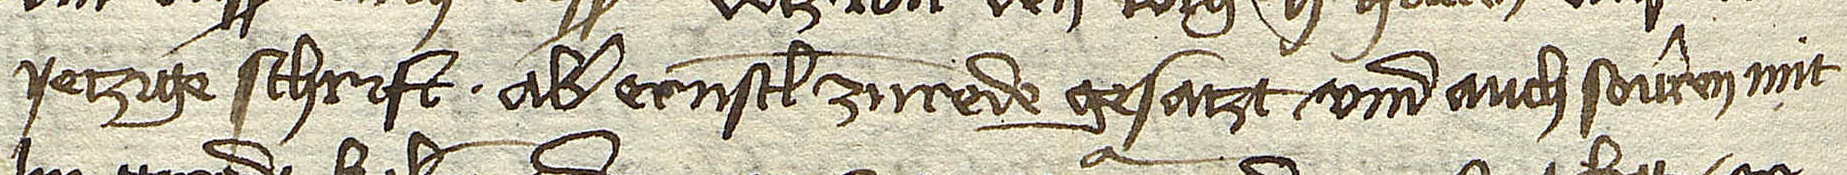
yecʒige ſchrift . ab* ernſtl* ʒurede geſacʒt vnd auch ſou*ren mit
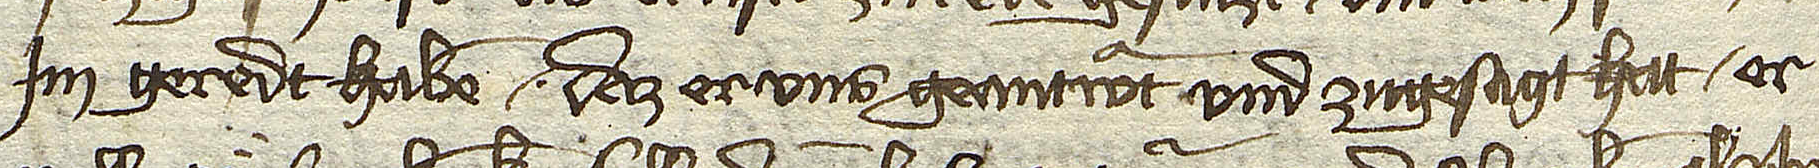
Im geredt habe* / . daʒ er vns geantw*t vnd ʒugeſagt hat / er
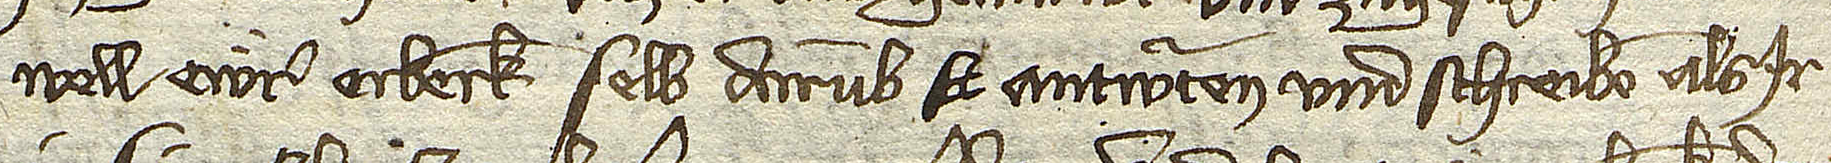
well ew*r erberk* ſelb daru*b ſc antw*ten vnd ſchreibe* als Ir
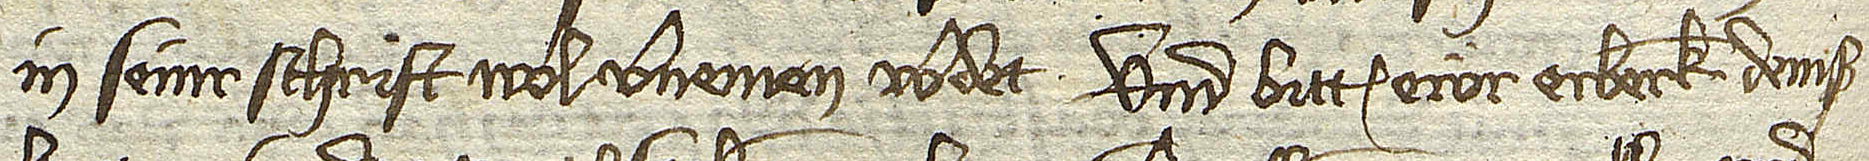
in ſeinr ſchrift wol v*nemen w*det . Vnd bitt* ewr erberk* demſ*
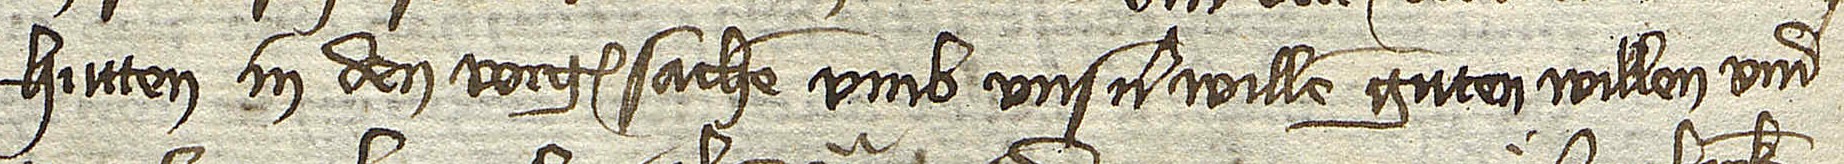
hutten in den vorg* ſache vmb vnſ*n wille* guten willen vnd
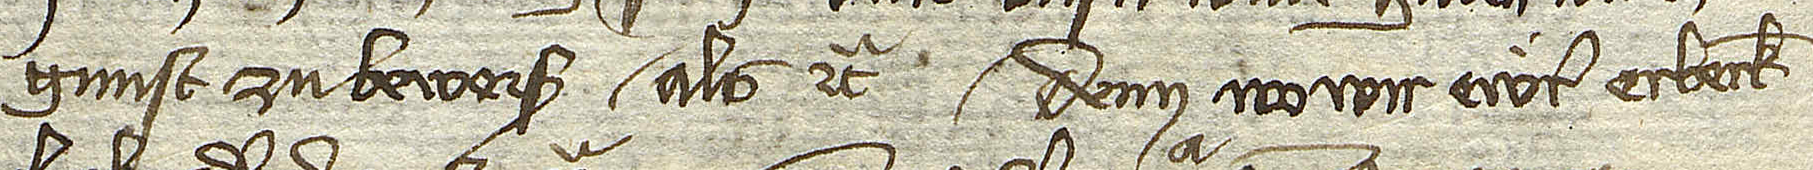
gunſt ʒu beweiſ* / als ec* / Denn wo wir ew*r erberk*
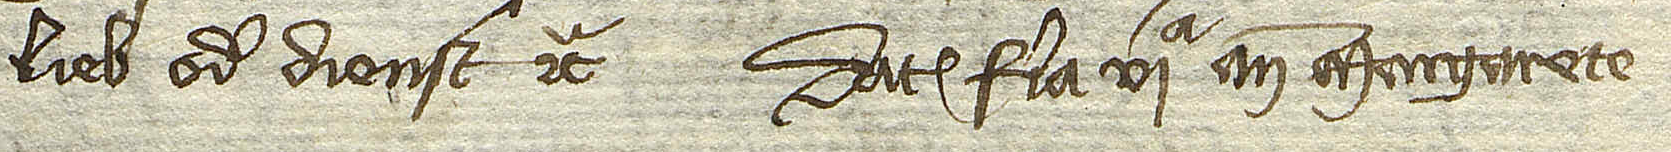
lieb od* dienſt ec* / Dat* fia* vi* an* Margarete
